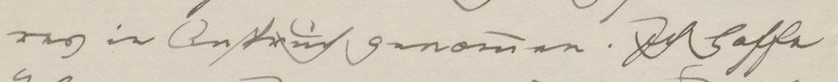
res in Anspruch genommen. Ich hoffe
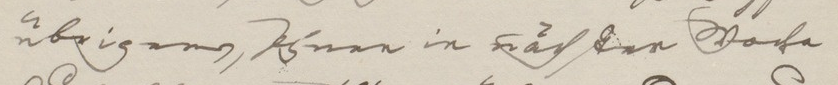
übrigens, Ihnen in nächster Woche
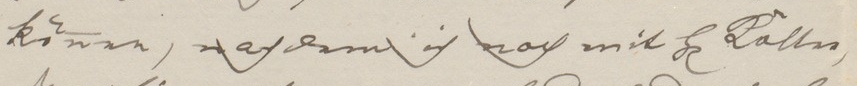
können, nachdem ich noch mit H Koller,
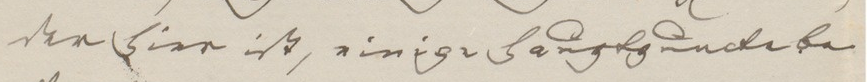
der hier ist, einige Hauptpuncte be-
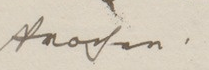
sprochen.
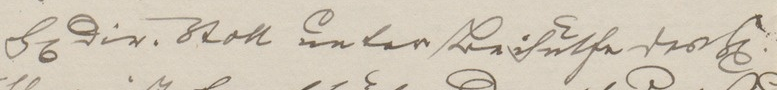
Hr Dir. Stoll unter Beihülfe des H.
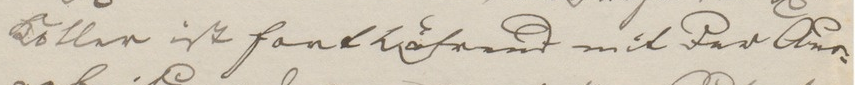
Koller ist fortwährend mit der Aus-
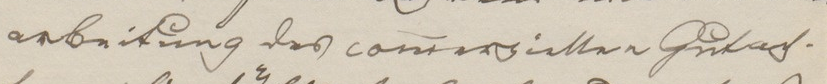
arbeitung des commerziellen Gutach-
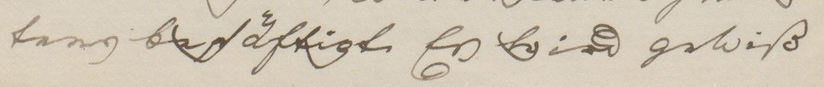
tens beschäftigt. Es wird gewiß
